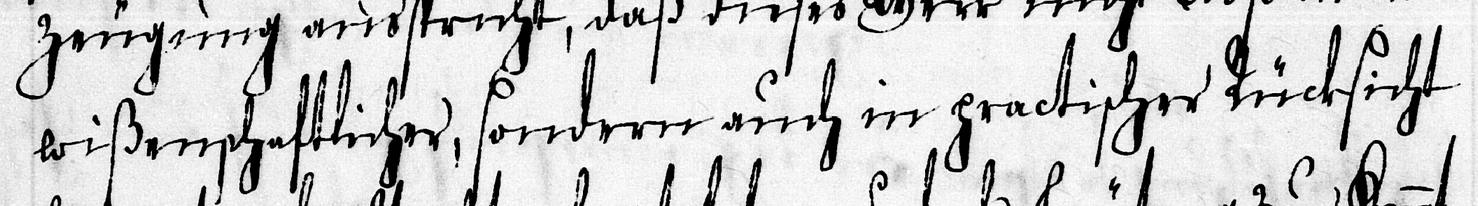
wißenschaftlicher, sondern auch in practischer Rücksicht
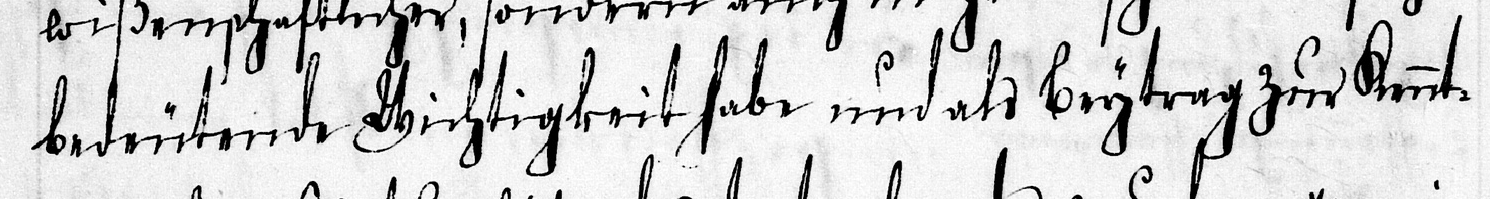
bedeutende Wichtigkeit habe und als Beytrag zur Kennt¬
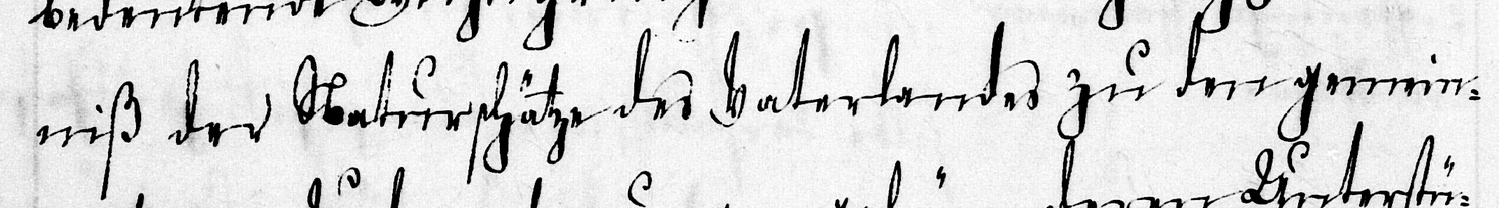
niß der Naturschätze des Vaterlandes zu den gemein¬
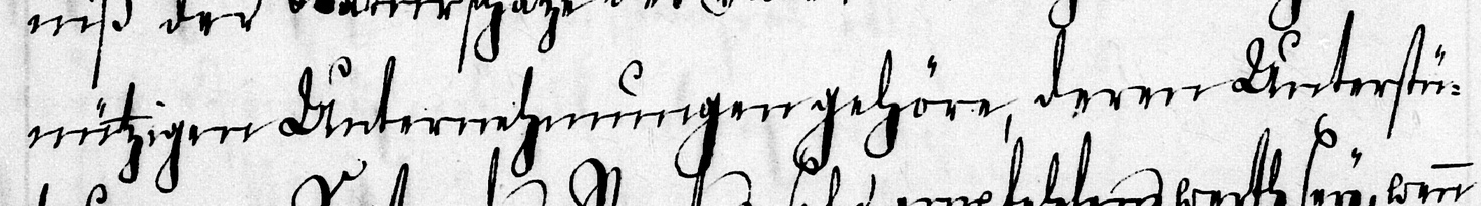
nützigen Unternehmungen gehöre, deren Unterstü¬
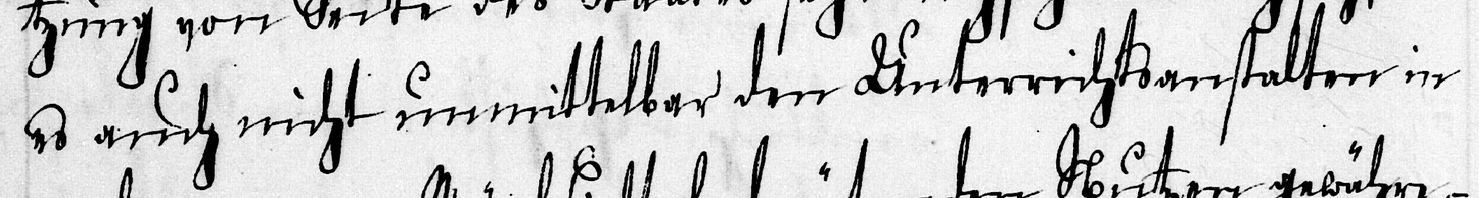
es auch nicht unmittelbar den Unterrichtsanstalten in
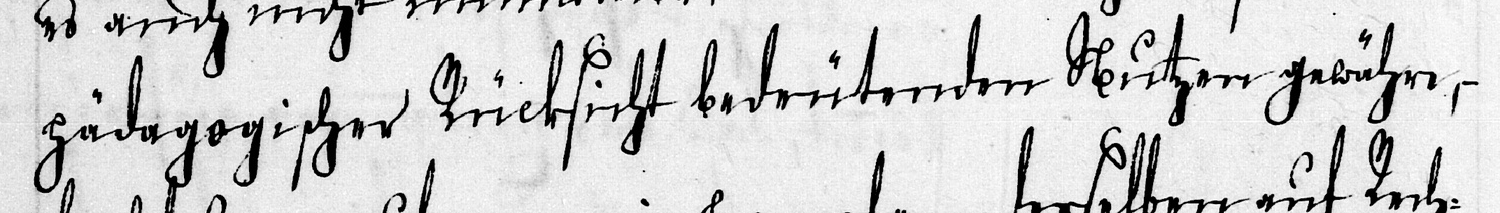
pädagogischer Rücksicht bedeutenden Nutzen gewähre,
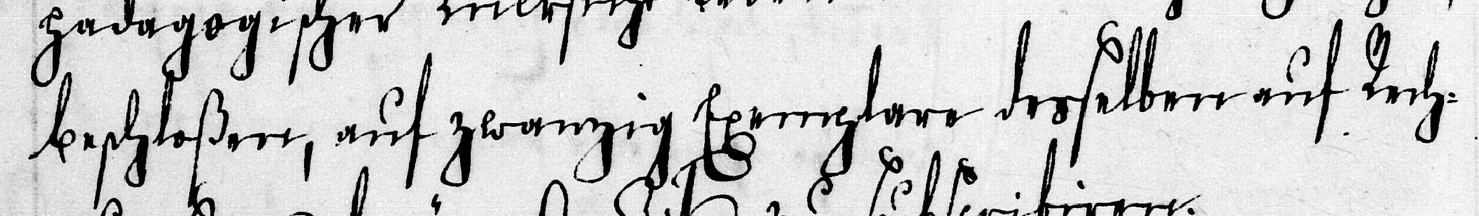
beschloßen, auf zwanzig Exemplare desselben auf Rech¬
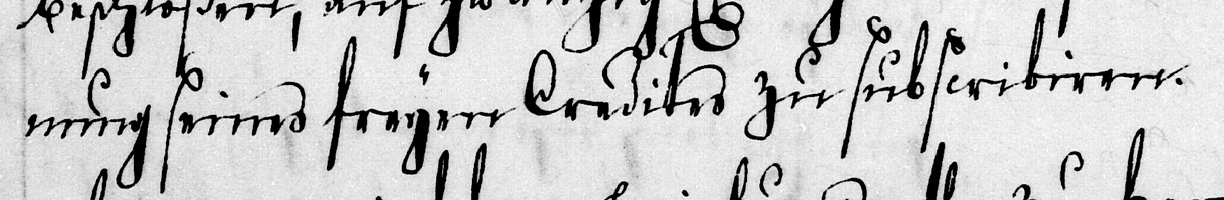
nung seines freyen Credites zu subscribiren.
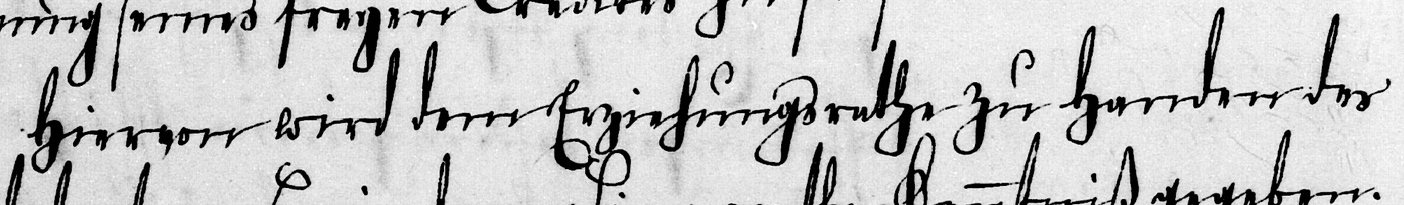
Hiervon wird dem Erziehungsrathe zu Handen des
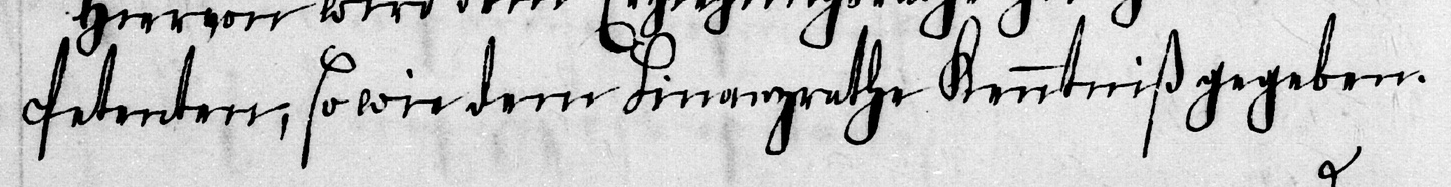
Petenten, sowie dem Finanzrathe Kenntniß gegeben.
